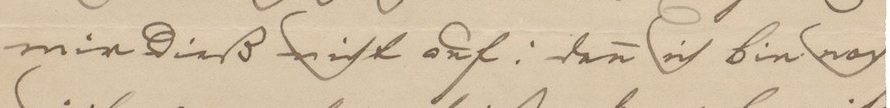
mir dieß nicht auf: denn ich bin noch
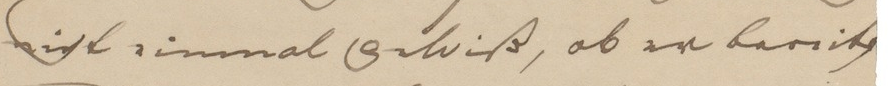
nicht einmal gewiß, ob er bereits
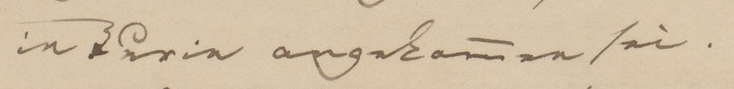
in Turin angekommen sei.
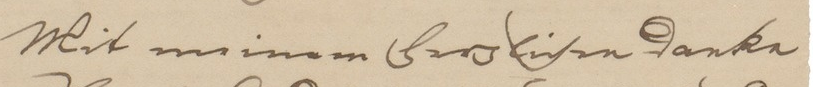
Mit meinem herzlichen Danke
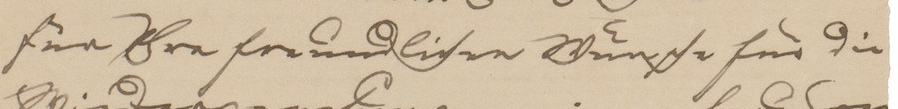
für Ihre freundlichen Wünsche für die
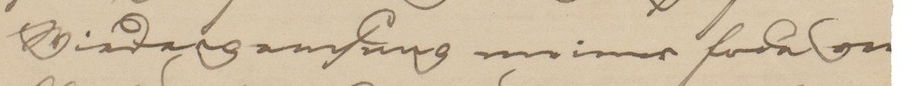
Wiedergenesung meiner Frau ver-
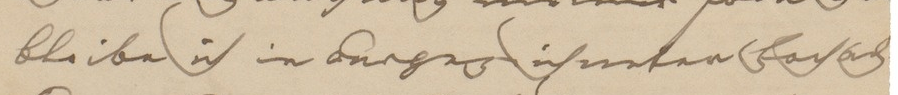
bleibe ich in ausgezeichneter Hochach-
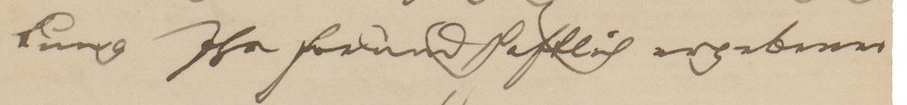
tung Ihr freundschaftlich ergebener
